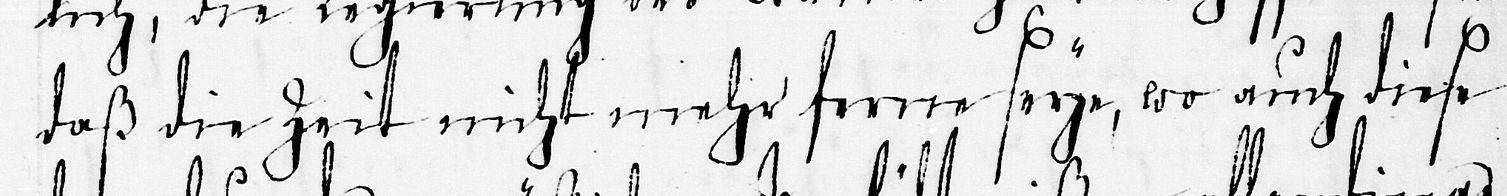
daß die Zeit nicht mehr ferne seye, wo auch diese
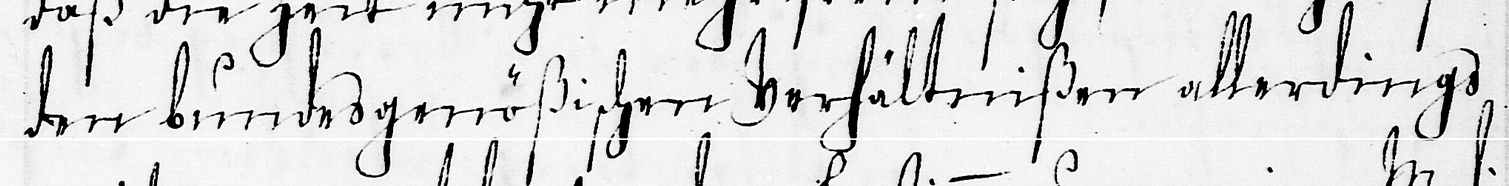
den bundesgenößischen Verhältnißen allerdings
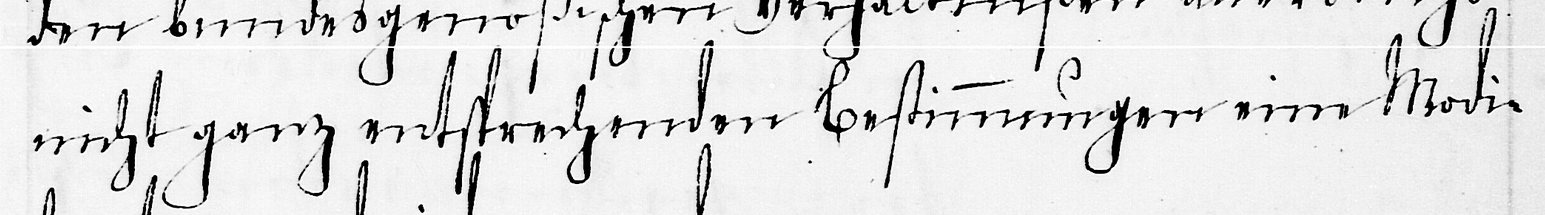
nicht ganz entsprechenden Bestimmungen eine Modi¬
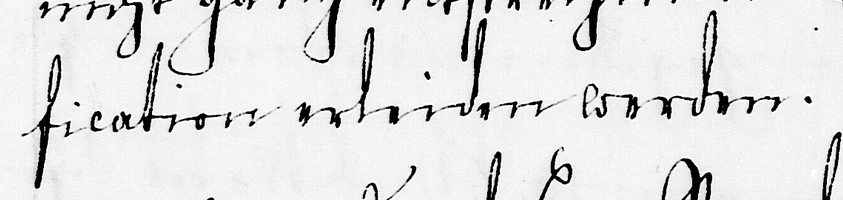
fication erleiden werden.
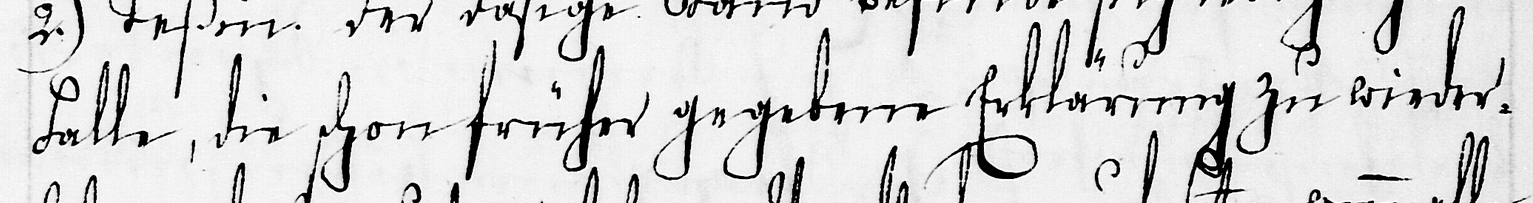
Falle, die schon früher gegebene Erklärung zu wieder¬
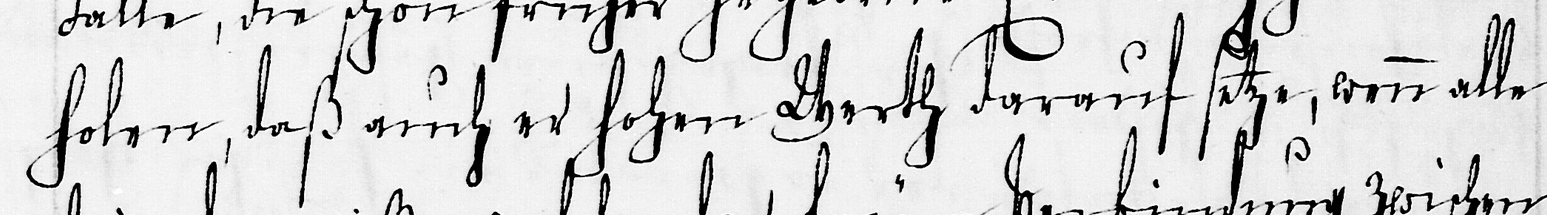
holen, daß auch er hohen Werth darauf setze, wenn al¬
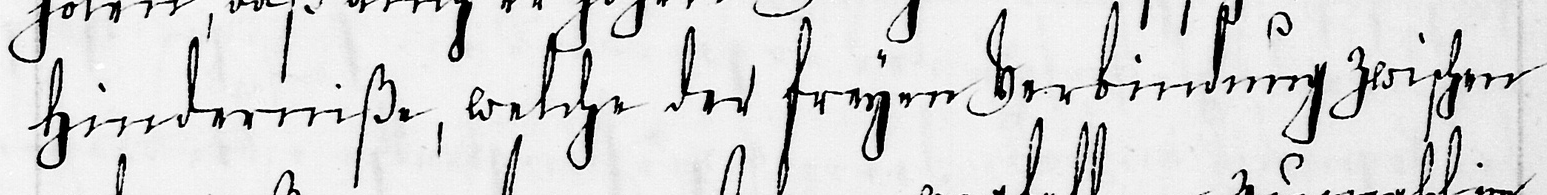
Hinderniße, welche der freyen Verbindung zwischen
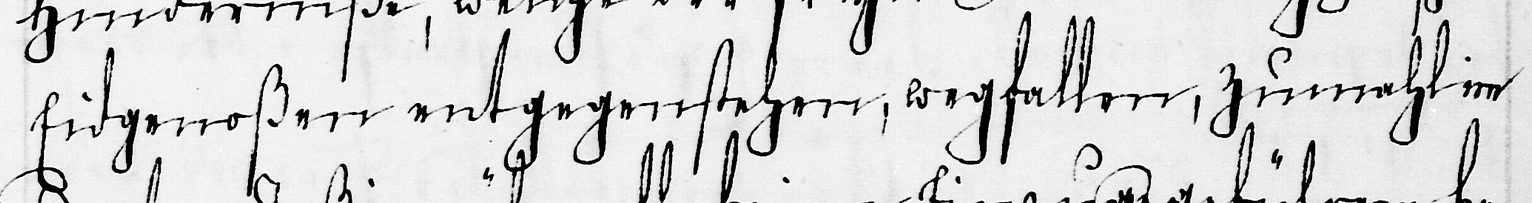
Eidgenoßen entgegenstehen, wegfallen, zumahl im
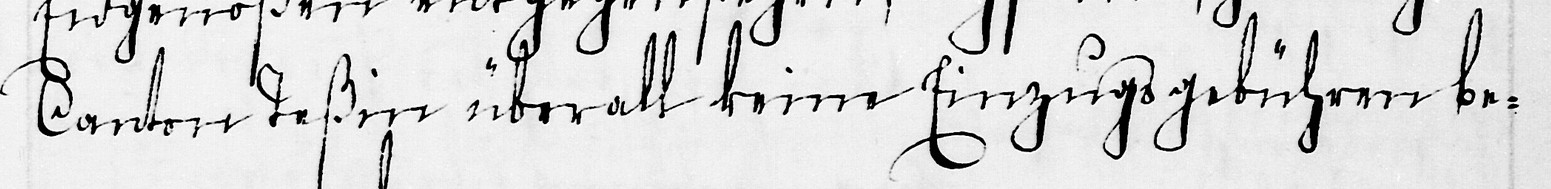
Canton Teßin überall keine Einzugsgebühren be¬
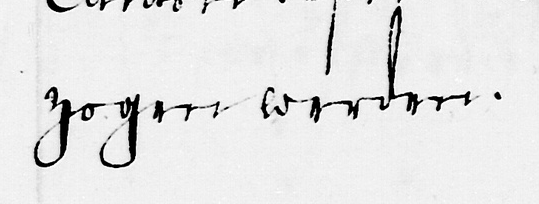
zogen werden.
